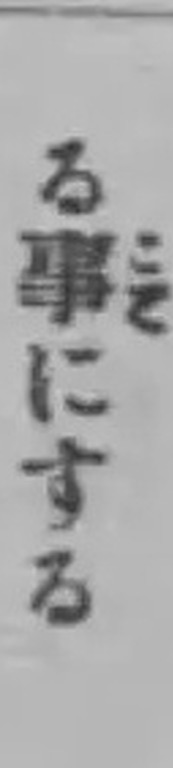る事にする
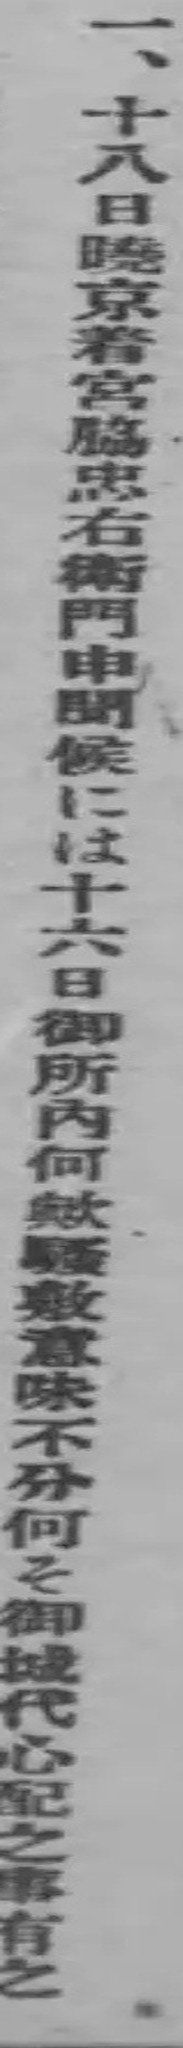一、十八日暁京着宮脇忠右衛門申聞候には十六日御所内何歟騒敷意味不分何そ御城代心配之事有之
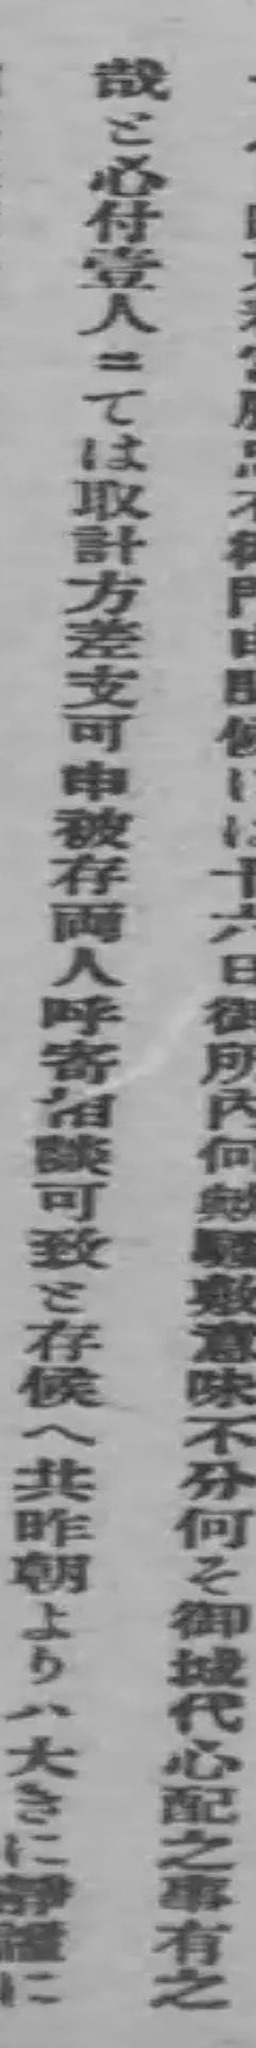哉と心付壱人ニては取計方差支可申被存両人呼寄相談可致と存候へ共昨朝よりハ大きに静謐に
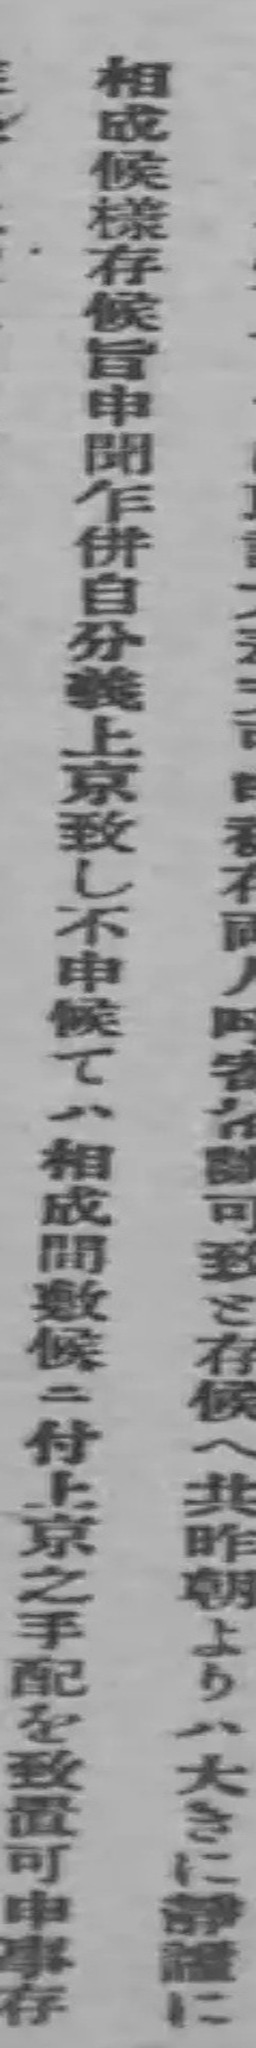相成候様存候旨申聞乍併自分義上京致し不申候てハ相成間敷候ニ付上京之手配を致置可申事存
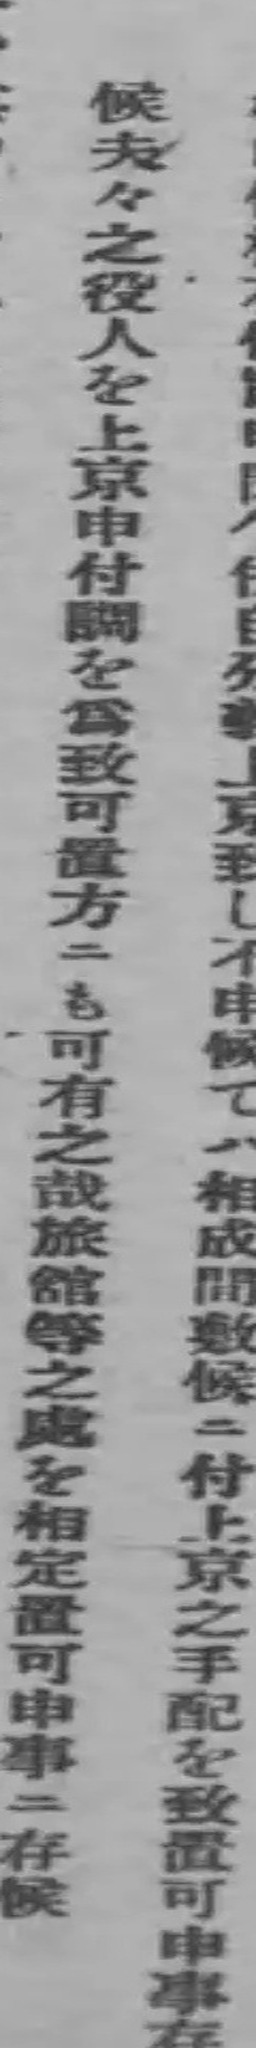候夫々之役人を上京申付調を為致可置方ニも可有之哉旅館等之処を相定置可申事に存候
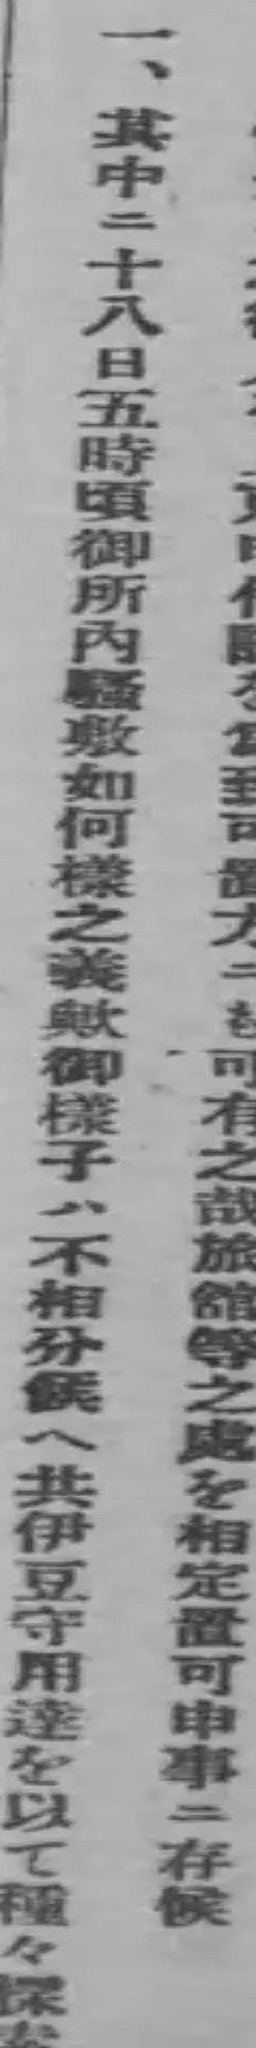一、其中ニ十八日五時頃御所内騒敷如何様之義歟御様子ハ不相分候へ共伊豆守用達を以て種々探索
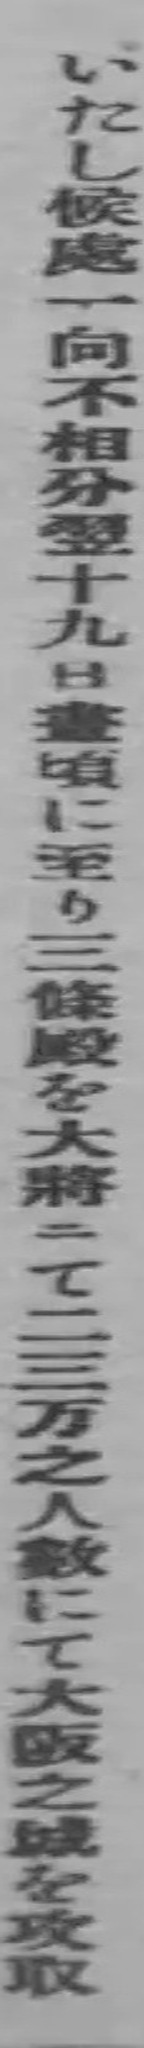いたし候処一向不相分翌十九日昼頃に至り三條殿を大将ニて二三万之人数にて大阪之城を攻取
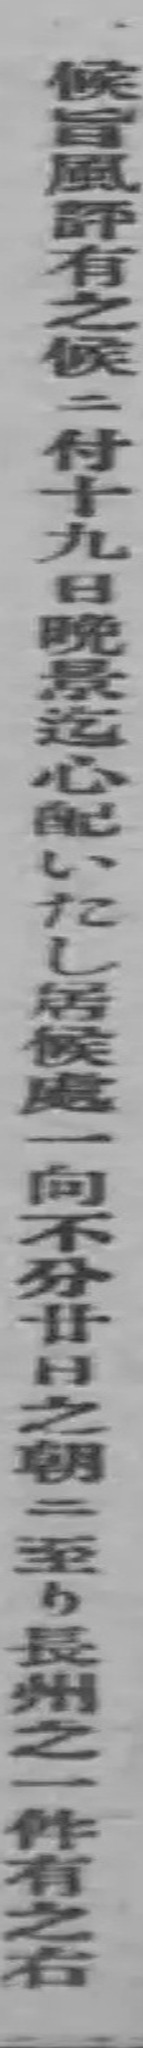候旨風評有之候ニ付十九日晩景迄心配いたし居候処一向不分廿日之朝ニ至り長州之一件有之右
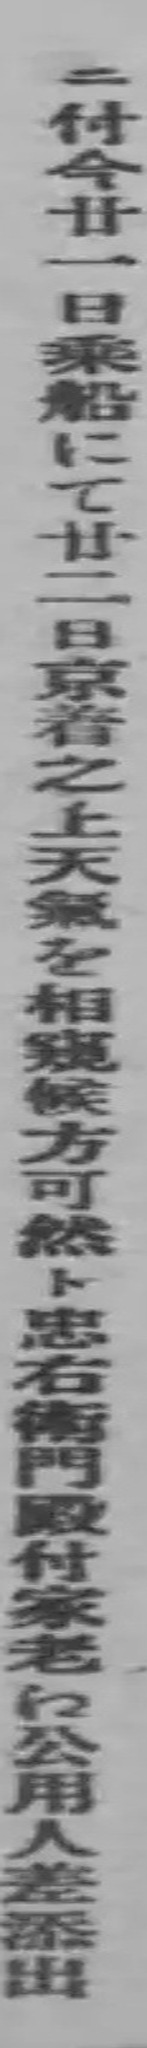ニ付今廿一日乗船にて廿二日京着之上天気を相窺候方可然ト忠右衛門殿付家老え公用人差添出
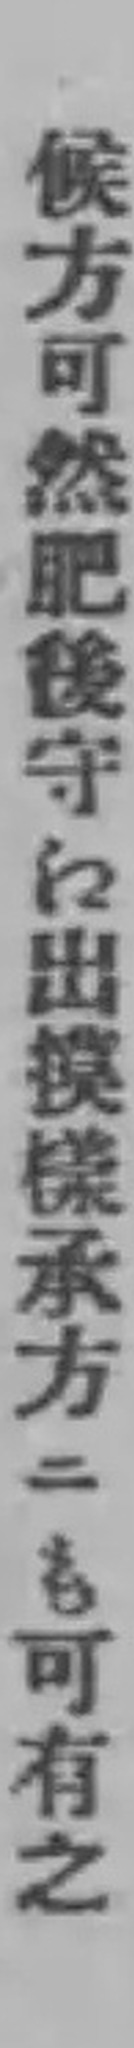候方可然肥後守え出摸様承方ニも可有之
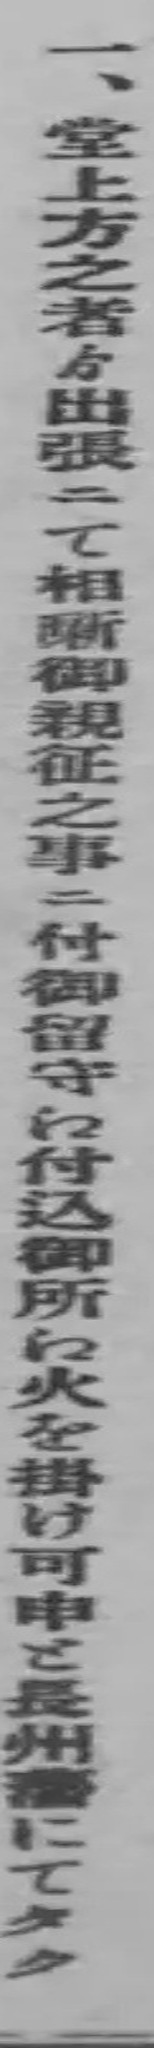一、堂上方之者ゟ出張ニて相噺御親征之事ニ付御留守え付込御所え火を掛け可申と長州藩にてタク
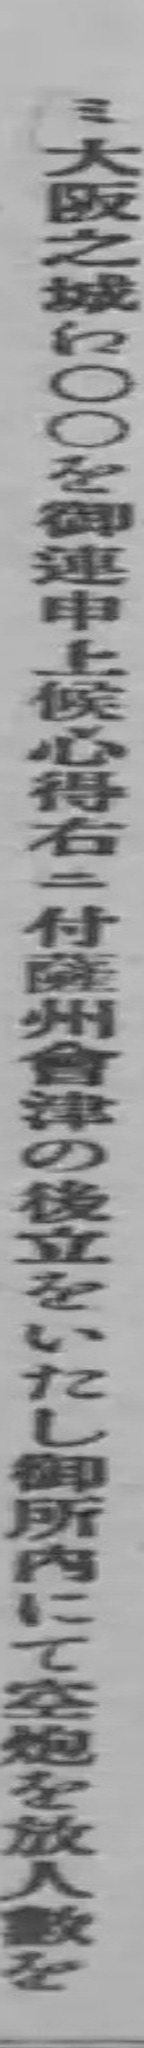ミ大阪之城え○○を御連申上候心得右ニ付薩州会津の後立をいたし御所内にて空炮を放人数を
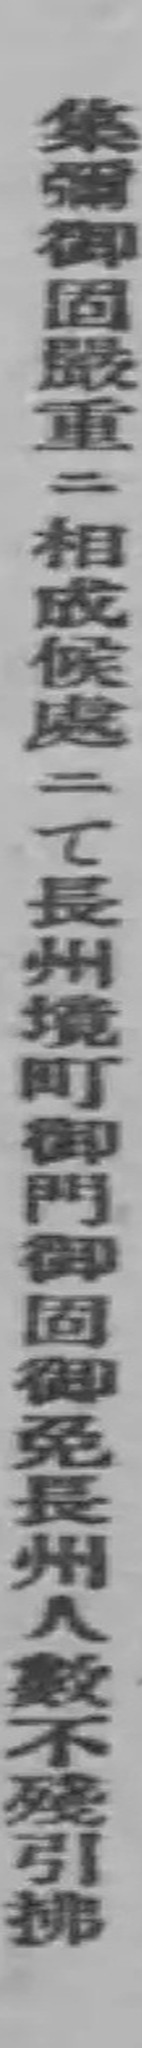集彌御固厳重ニ相成候処ニて長州境町御門御固御免長州人数不残引払
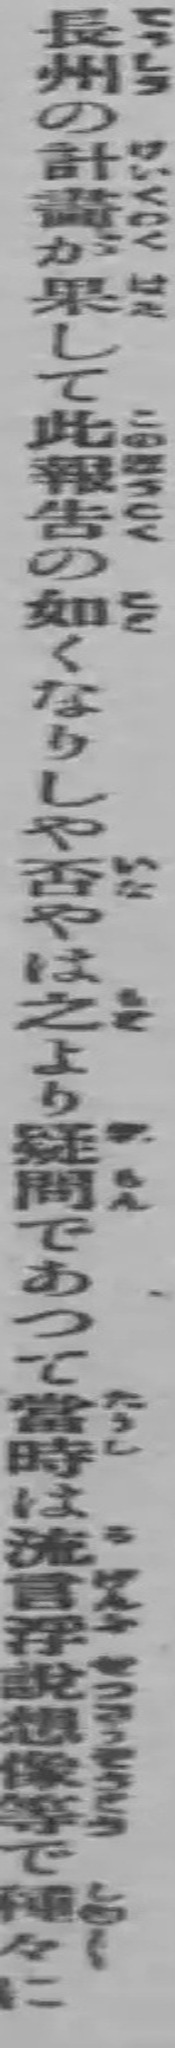長州の計画が果して此報告の如くなりしや否やは之より疑問であつて当時は流言浮説想像等で種々に
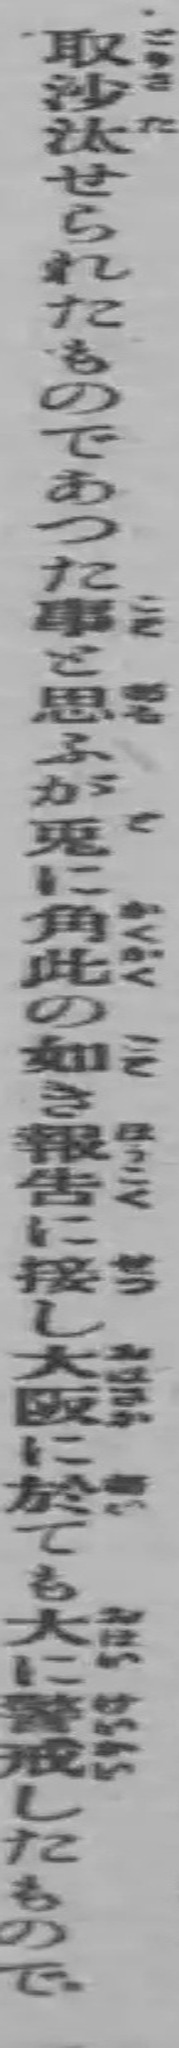取沙汰せられたものであつた事と思ふが兎に角此の如き報告に接し大阪に於ても大に警戒したもので
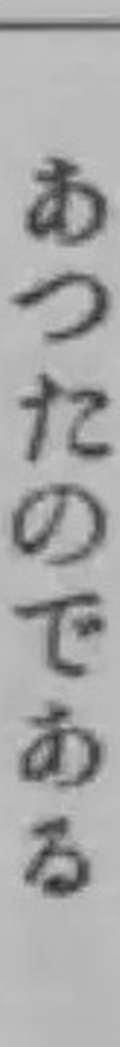あつたのである
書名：豊橋市史談
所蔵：国立国会図書館 National Diet Library, JAPAN
